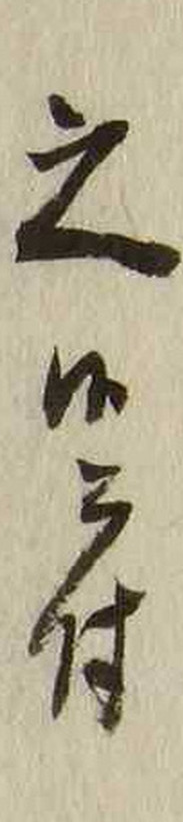之候ニ付
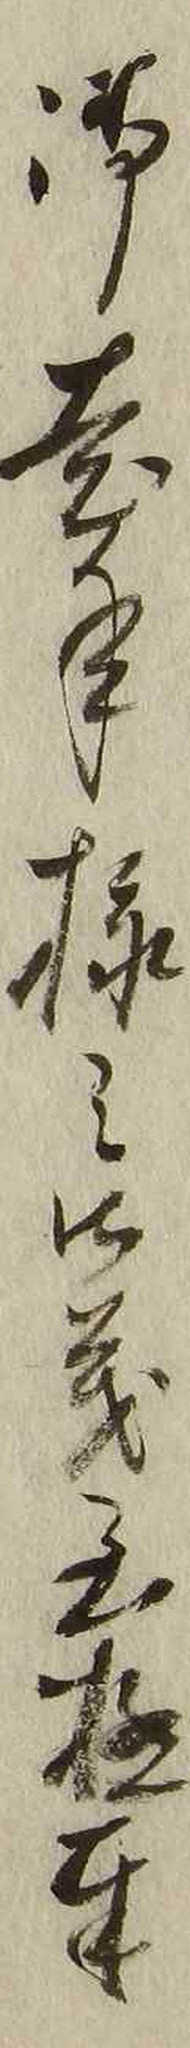御老年様之御義至極奉
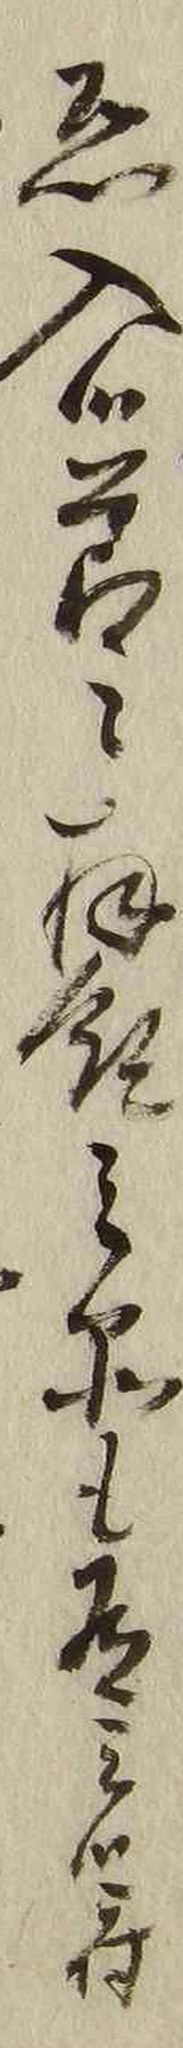恐入候節ニ拝領之品も有之候ニ付
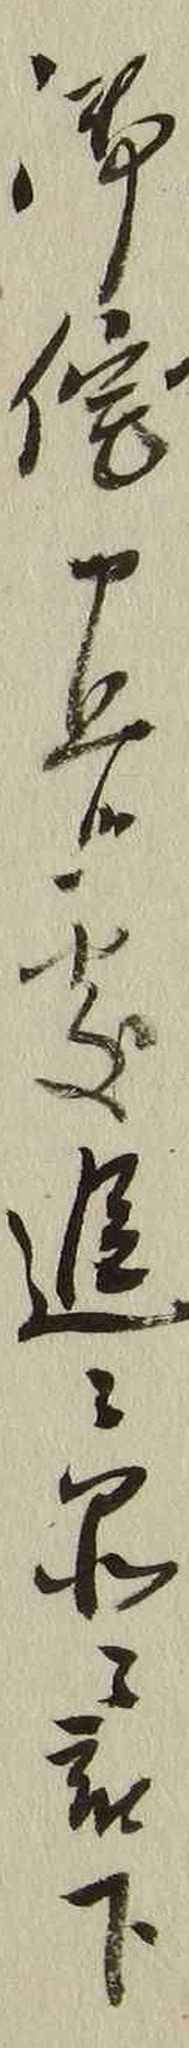御侘申上候処追々品々被下
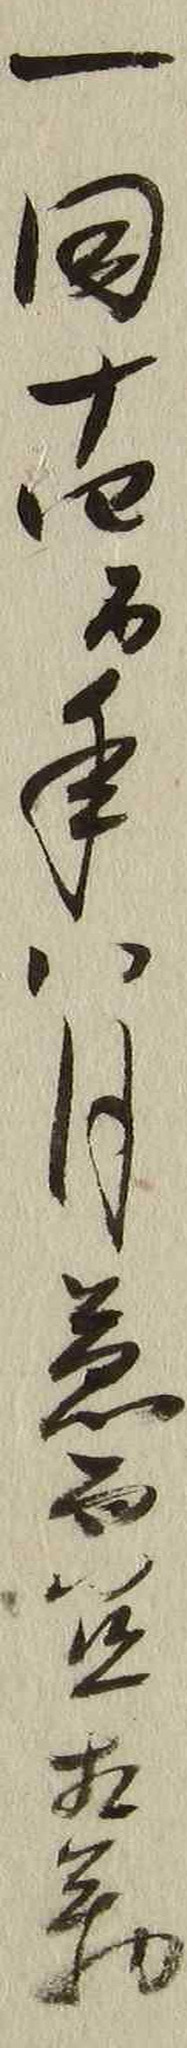一同十四酉年八月兼而宜相勤
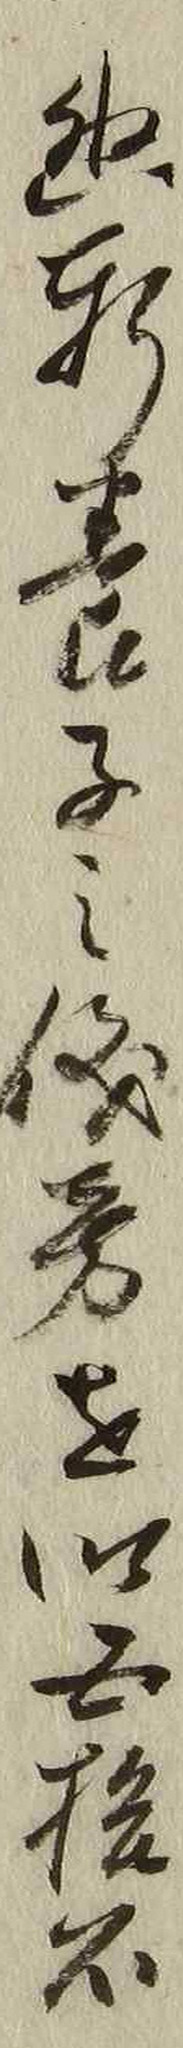幽軒養子之儀旁を以五拾石
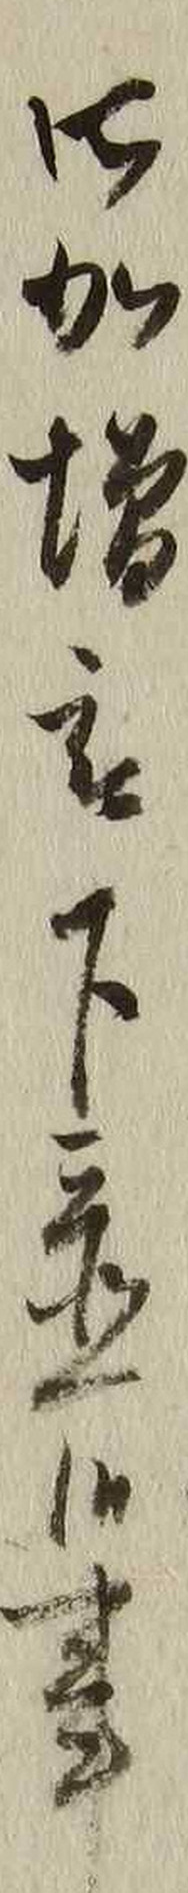御加増被下置候事
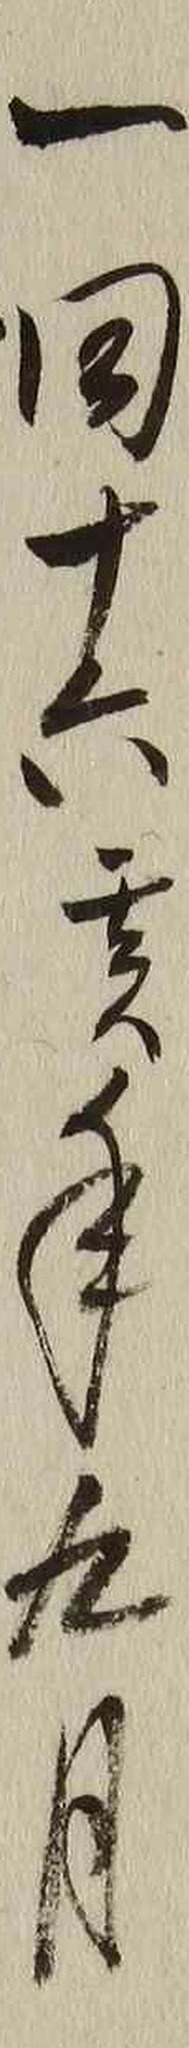一同十六亥年九月
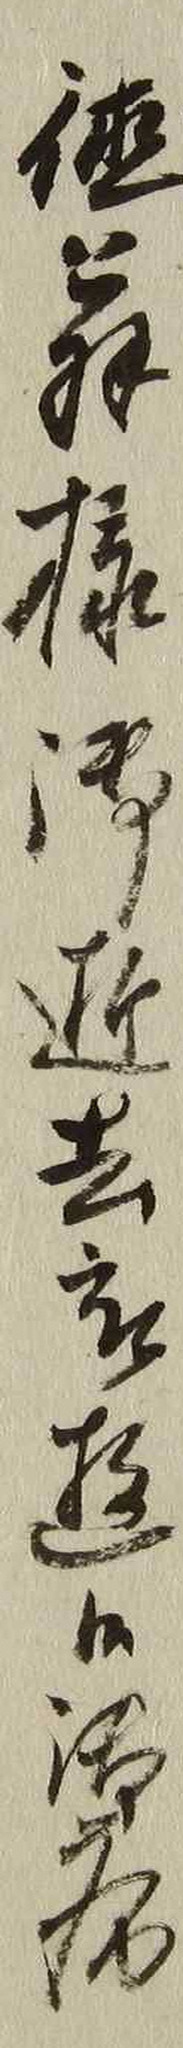徳翁様御逝去被遊候御病
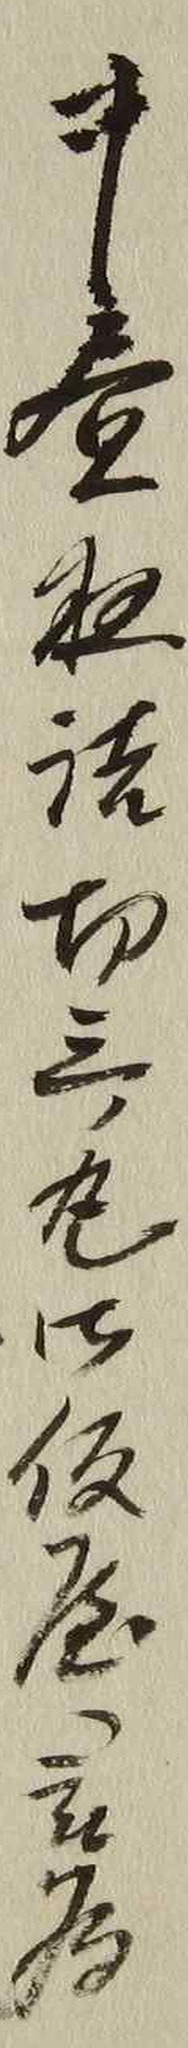中昼夜詰切三ノ丸御仮屋へ被為
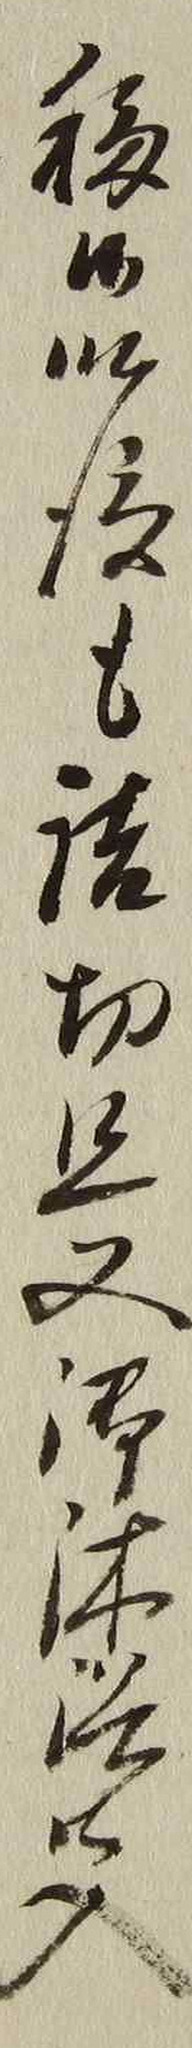移候以後も詰切且又御沐浴御入
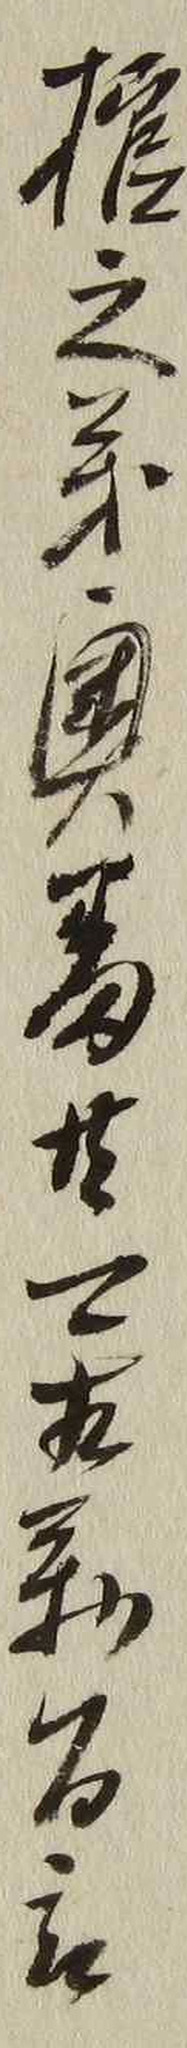棺之義奥番共可相勤旨被
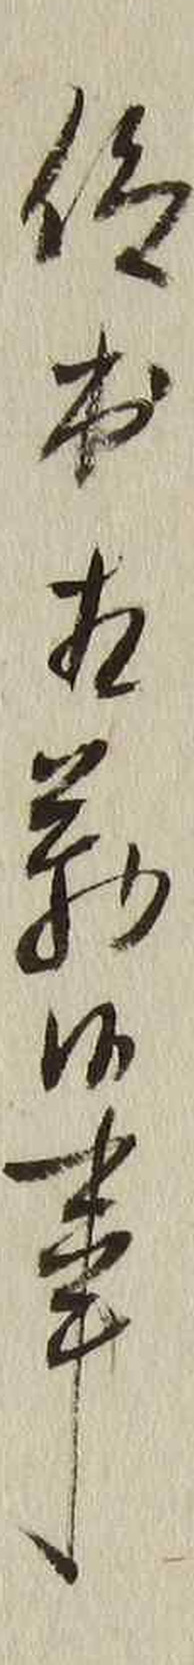仰出相勤候事
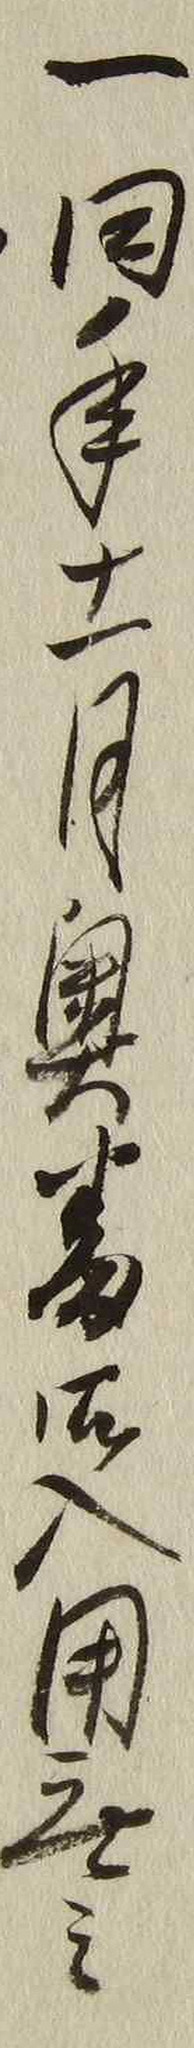一同年十一月奥番御入用無之
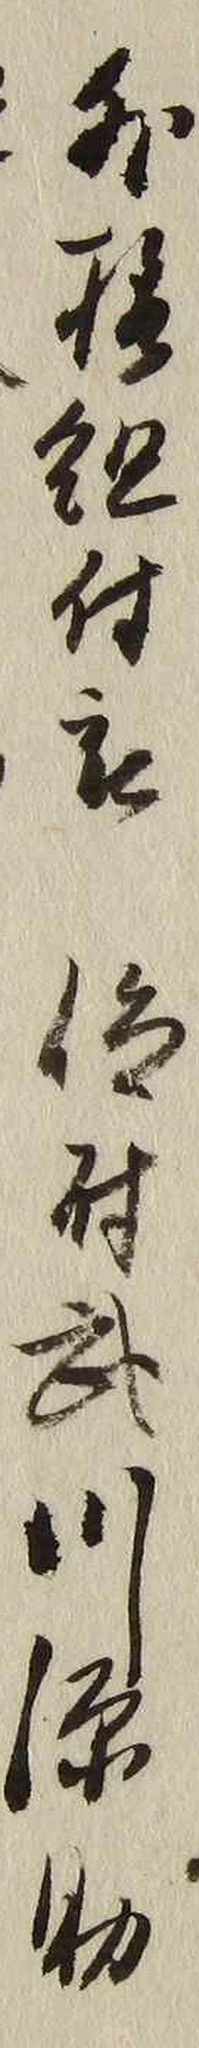外様組付被仰付武川源助
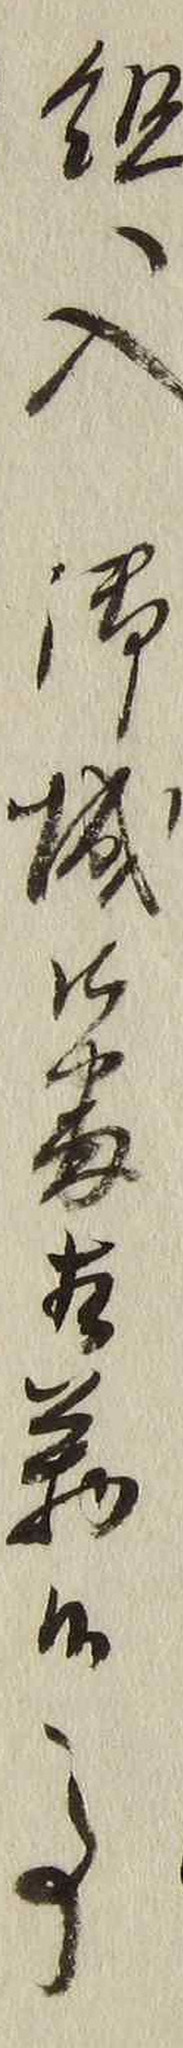組へ入御城御番相勤候事
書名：諸士系譜　巻之355　す之部5
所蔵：会津若松市立会津図書館
